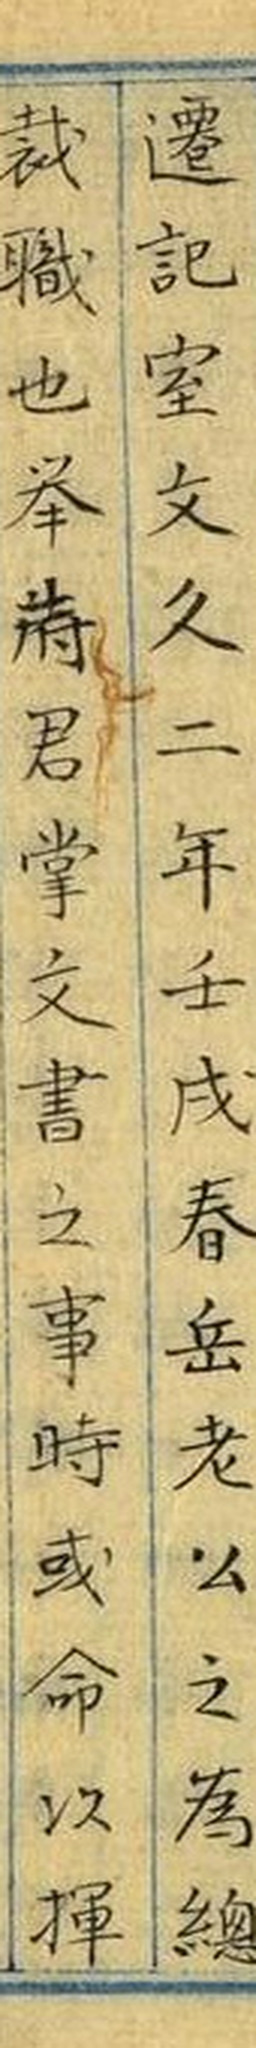裁職也挙府君掌文書之事時或命以揮
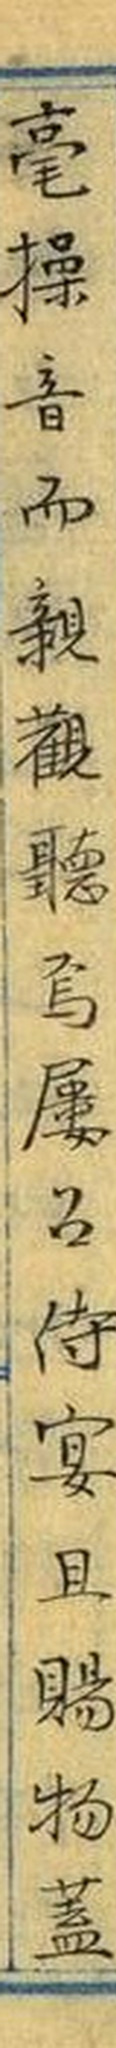毫操音而親觀聽焉屢召侍宴且賜物蓋

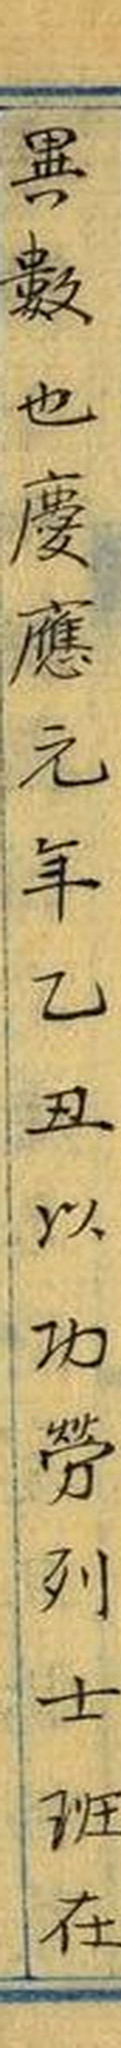異數也慶應元年乙丑以功勞列士班在
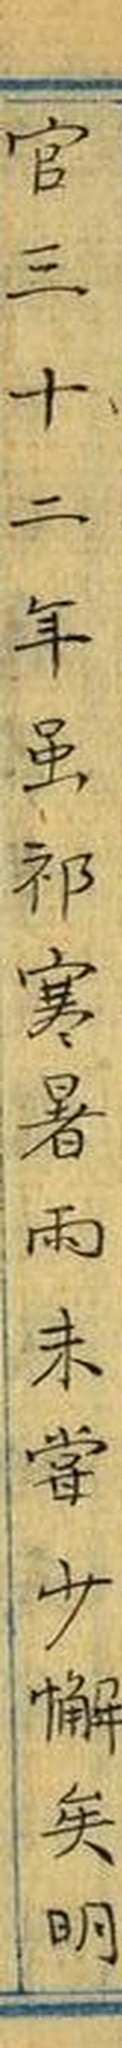官三十二年虽祁寒暑雨未甞少懈矣明
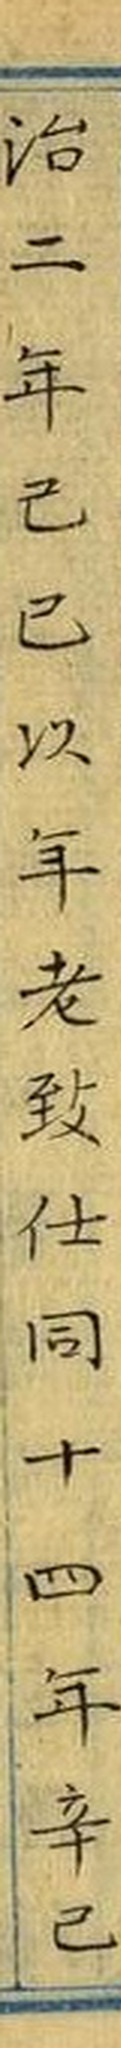治二年己巳以年老致仕同十四年辛巳
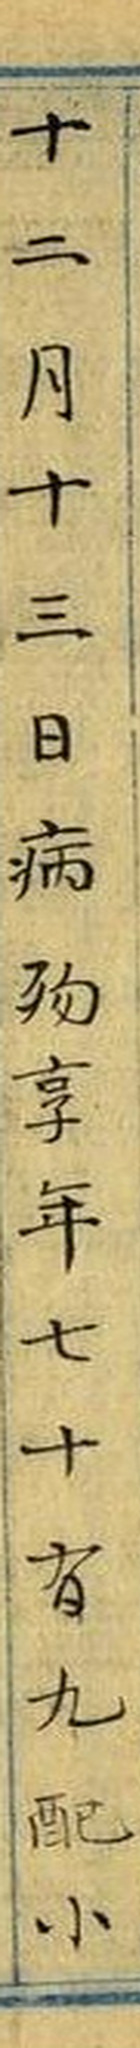十二月十三日病歾享年七十有九配小
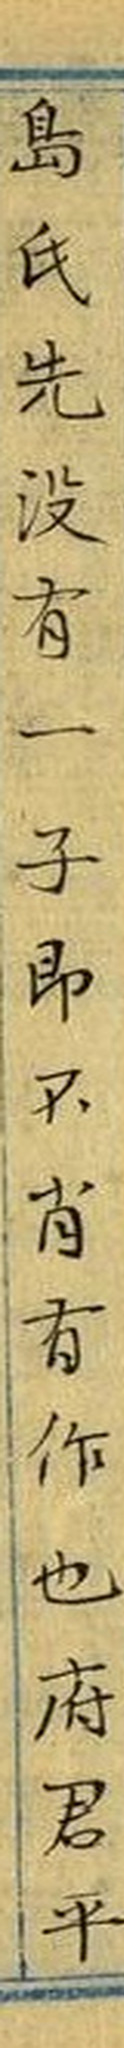島氏先没有一子即不肖有作也府君平
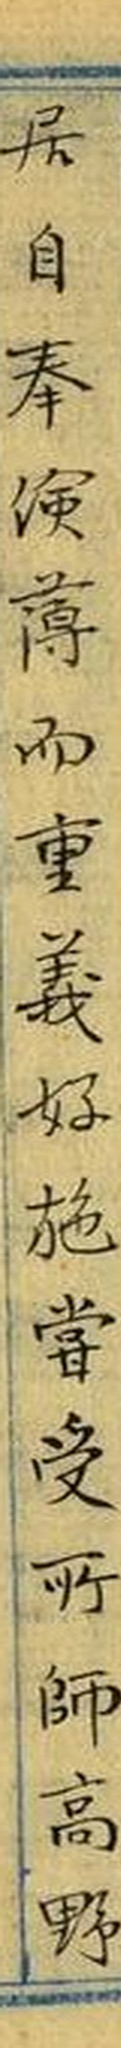居自奉倹薄而重義好施甞受所師高野
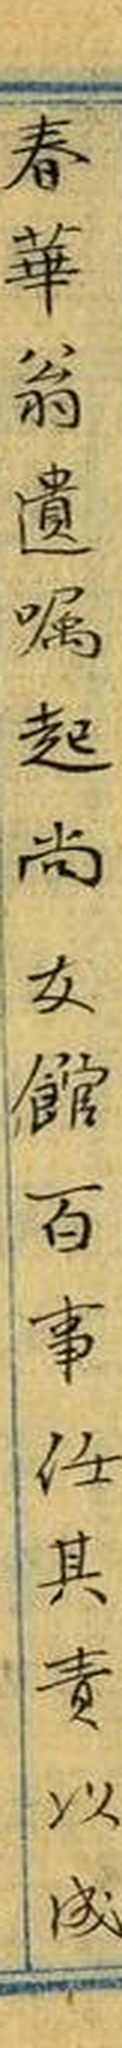春華翁遺嘱起尚友館百事任其責以成
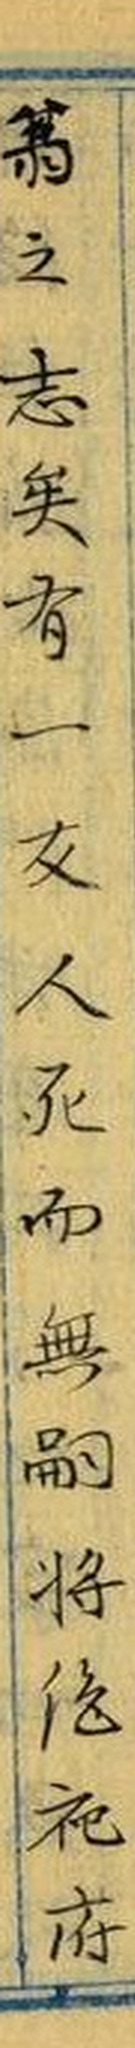翁之志矣有一友人死而無嗣将絶祀府
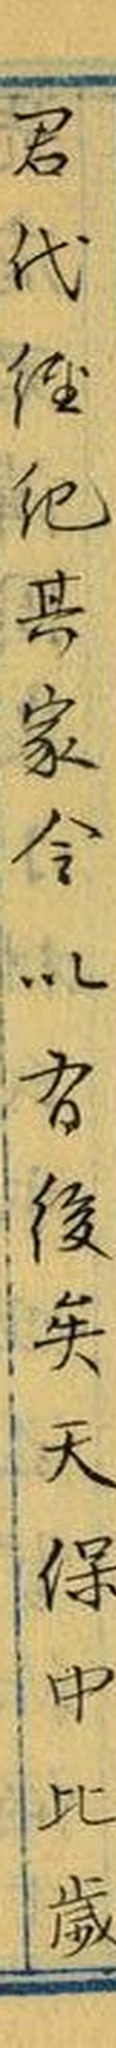君代經紀其家今以有後矣天保中比歲
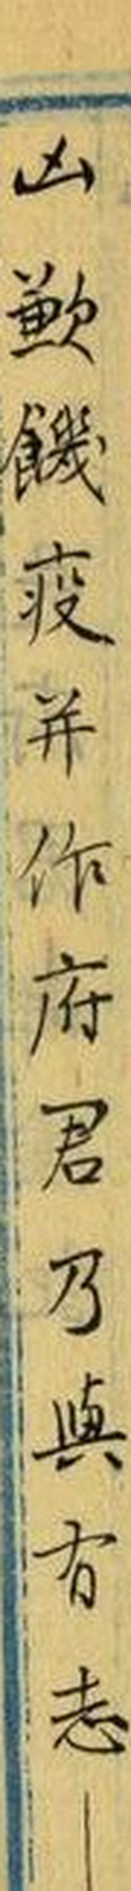凶歉饑疫并作府君乃與有志
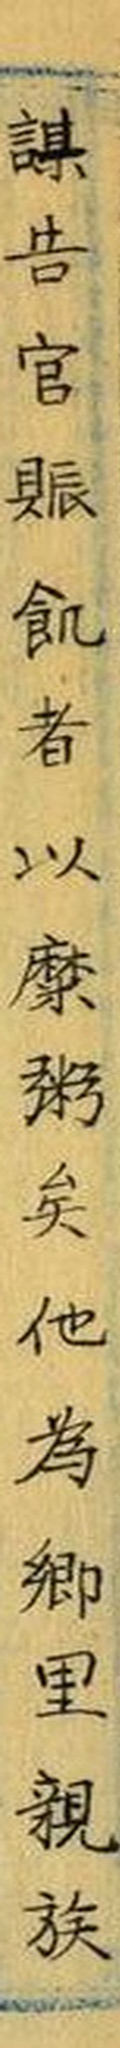謀告官賑飢者以糜粥矣他為郷里親族
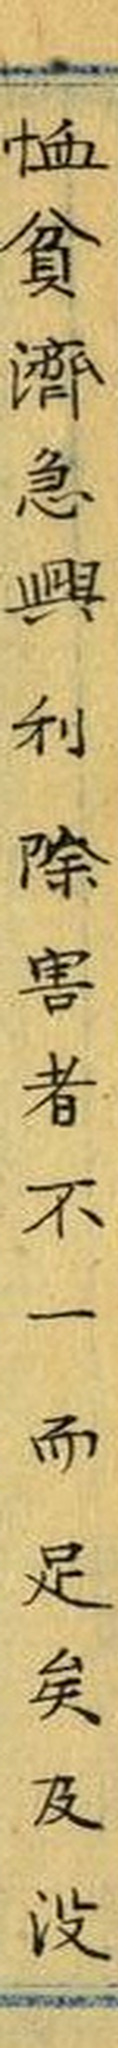恤貧濟急興利除害者不一而足矣及没
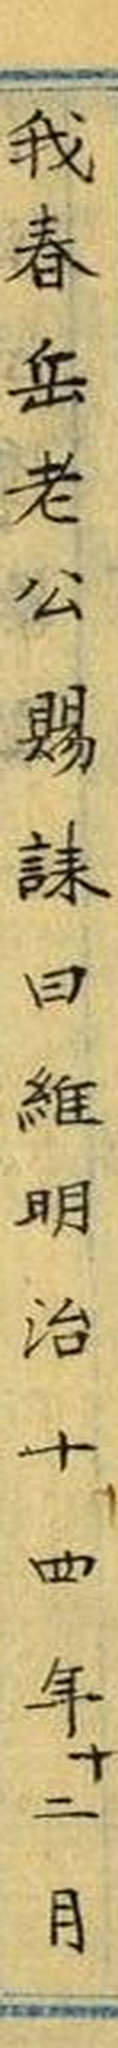我春岳老公賜誄曰維明治十四年十二月
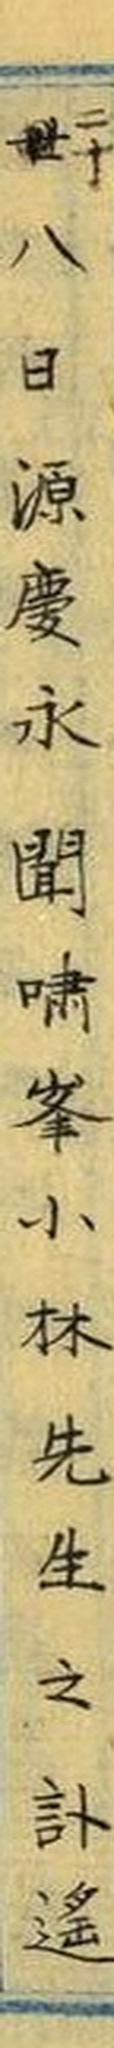二十八日源慶永聞嘯峯小林先生之訃遙
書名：温古集 四巻
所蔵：福井県文書館 Fukui Prefectural Archives
